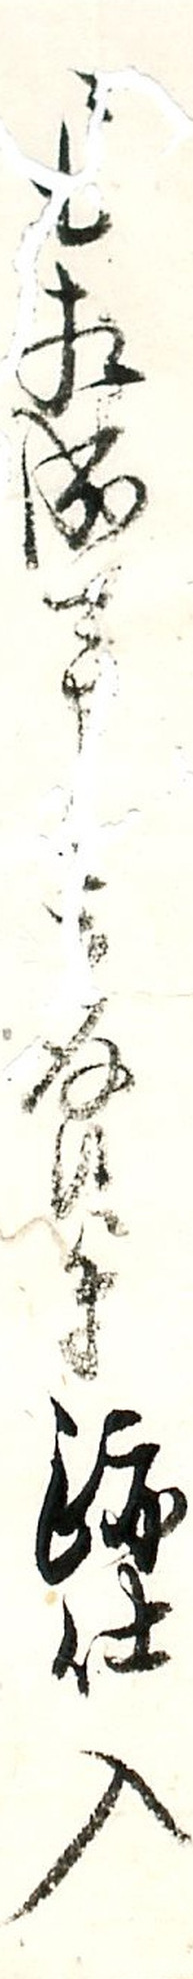にも相成可存候に付跡仕入
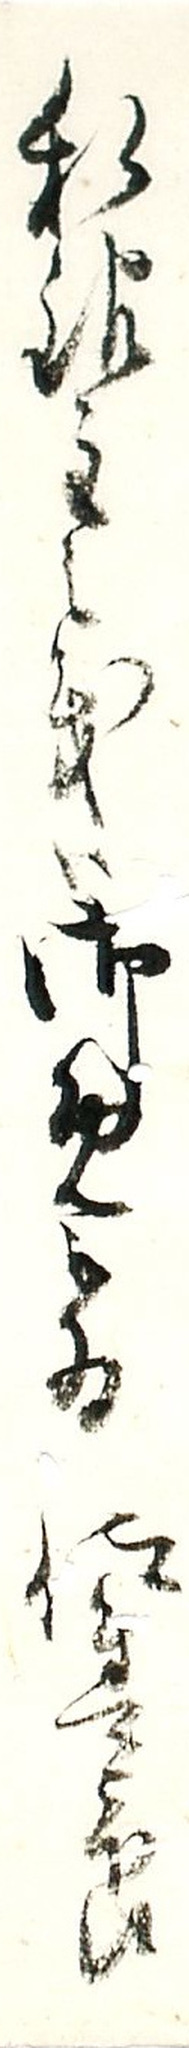私銀主之儀は御免被為仰付可被下候
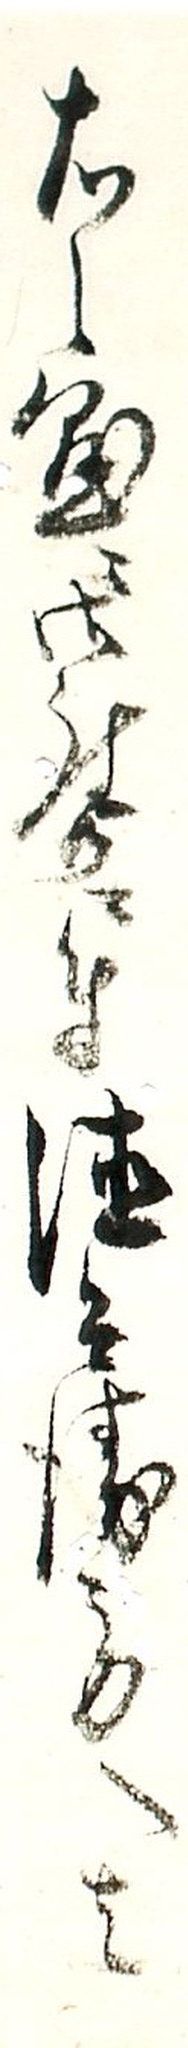右之懸に御座候に付徳兵衛方へは
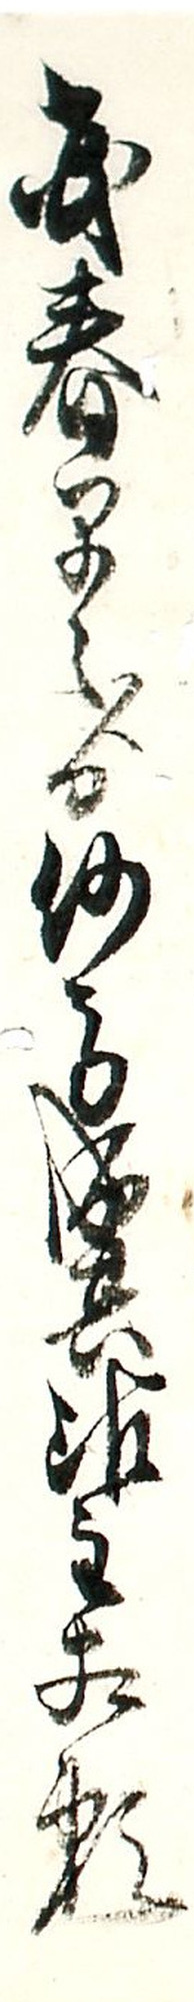当春早々ゟ何方成共銀主相頼
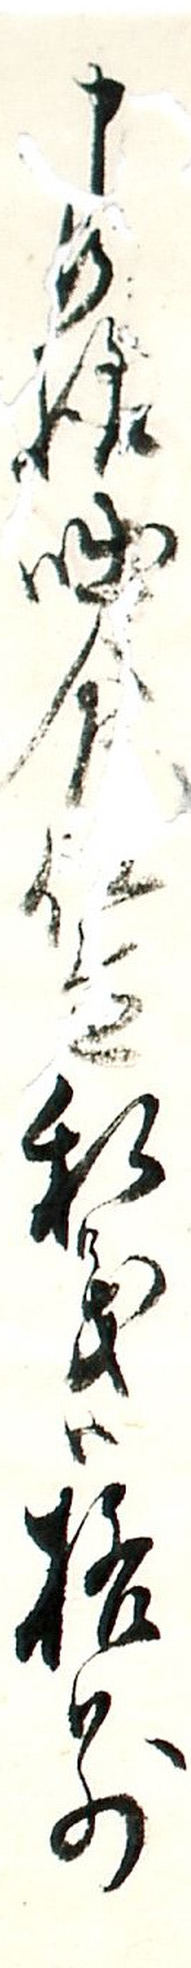申候様咄合仕置私義は格別
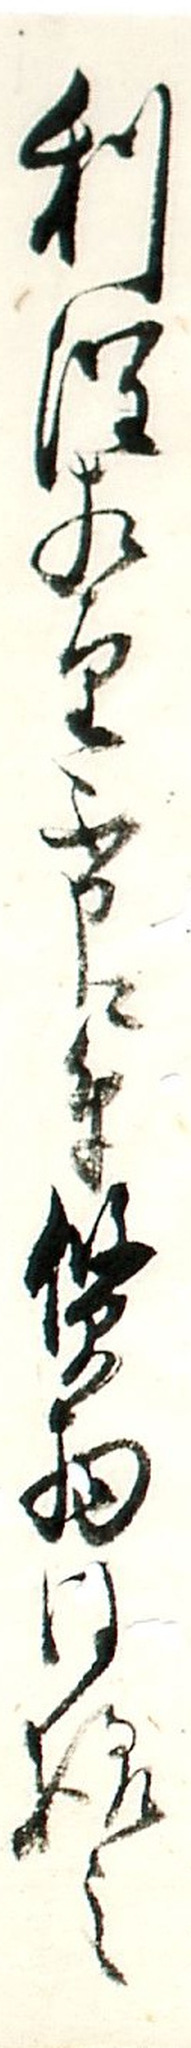利潤相望不申に付質物同様之
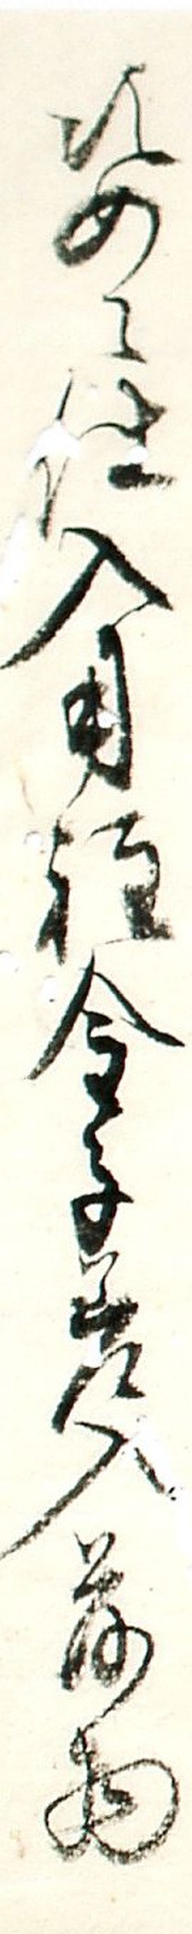姿ニ仕入用程金子差入荷物
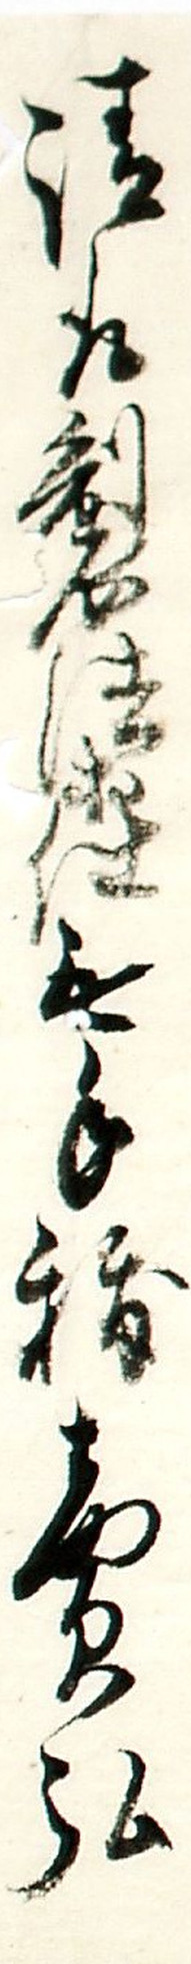請取製法等仕無手抜売弘
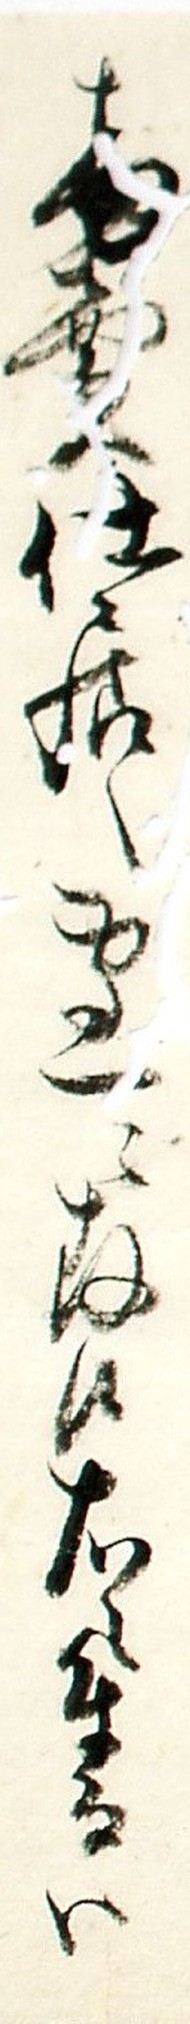商買仕居之専一に存候右に付而は
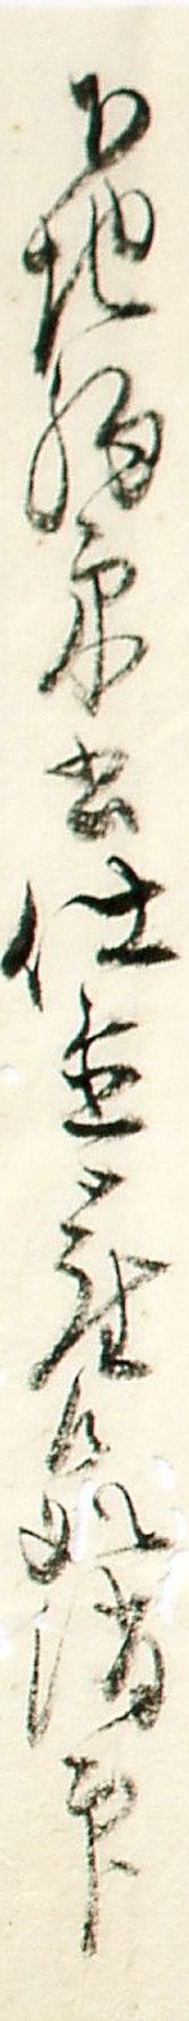下地約束書仕置御座候処消印
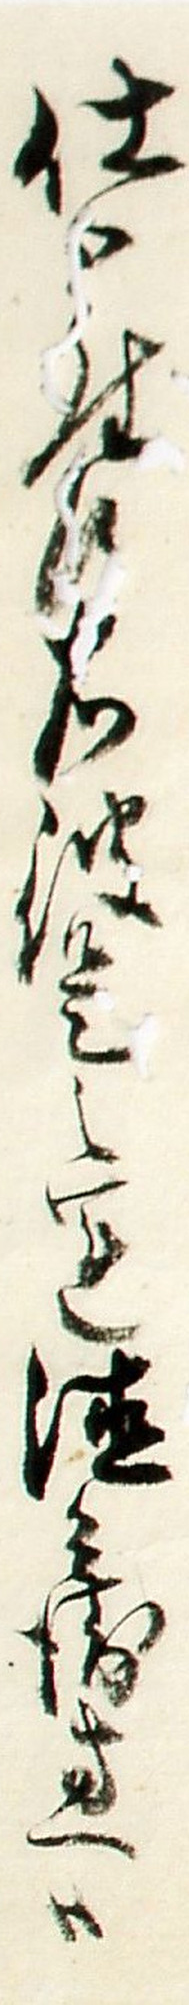仕御座候右彼是之運徳兵衛方へは

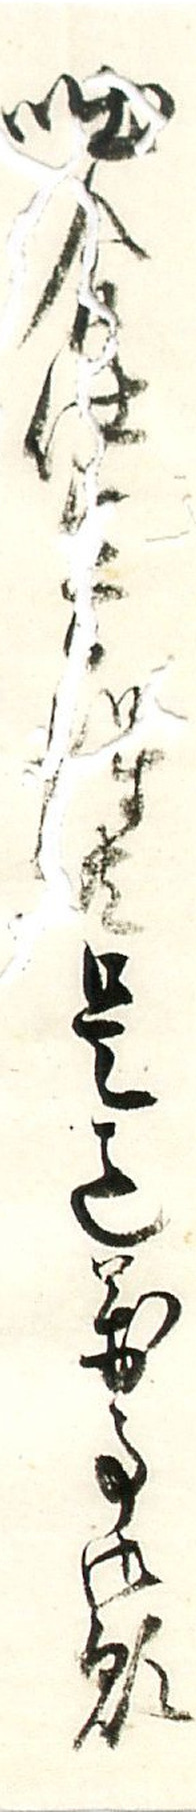咄合仕有之候得共是迄万事御願
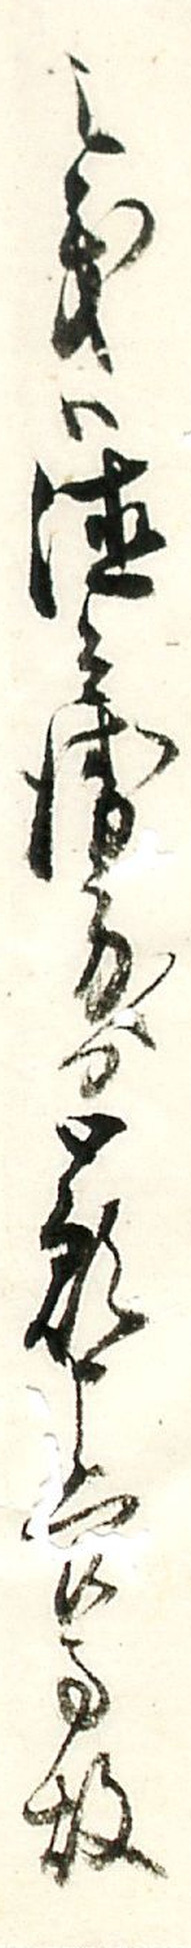之義は徳兵衛方ゟ御願申上候事故
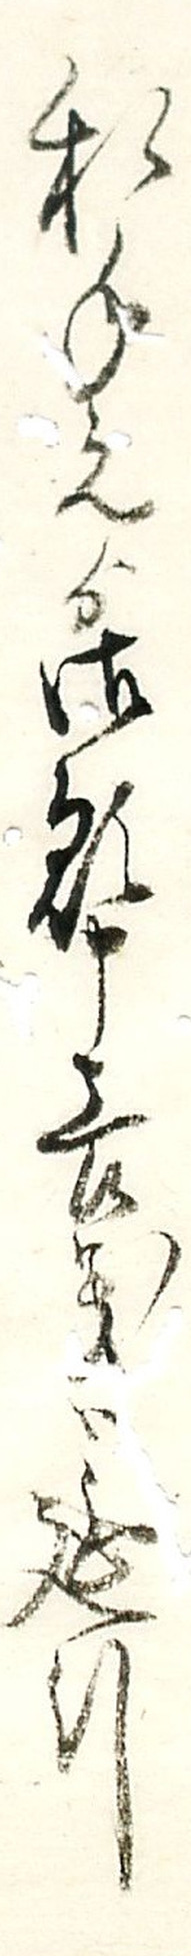私手元ゟ御願申上候義被延引
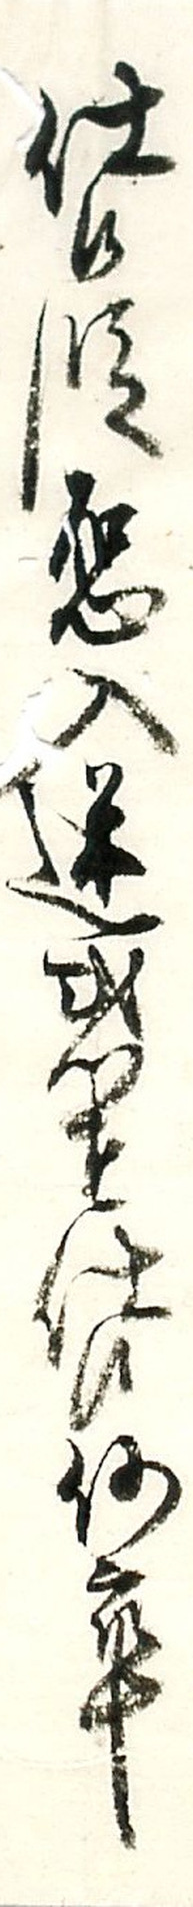仕候段恐入迷惑奉仕候何卒
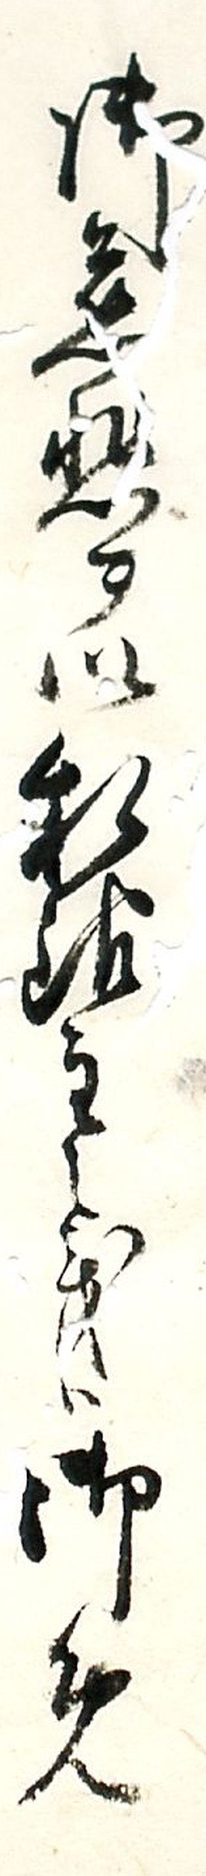御慈悲を以私銀主之義は御免
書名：乍恐横切ヲ以奉申上覚（山城谷漆買入銀一件ニ付）
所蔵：鳴門教育大学 Naruto University of Education
